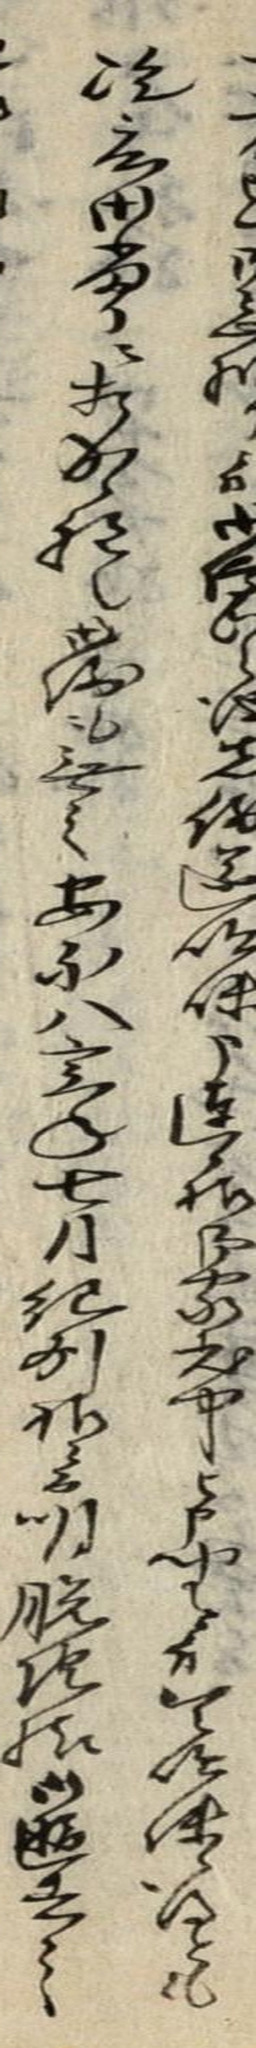屹度御当りに相成候程之御例も無之安永八亥年七月紀州様にて明脱院様御逝去之
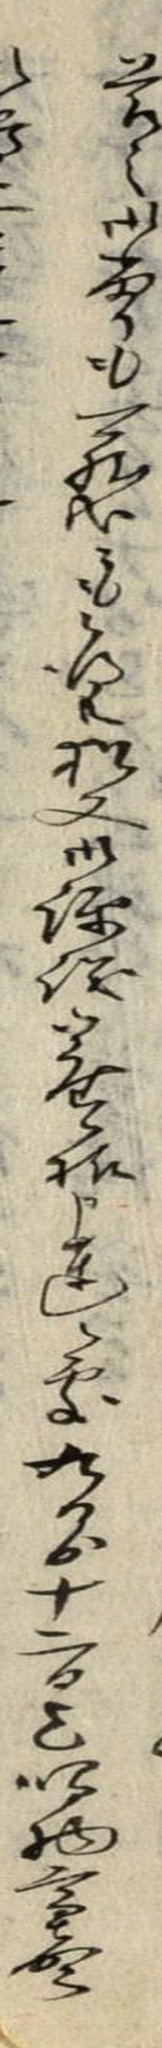節之御当りも可然哉にも候得共猶又御評議御座候様申達候処九日ゟ十二日迄鳴物高声
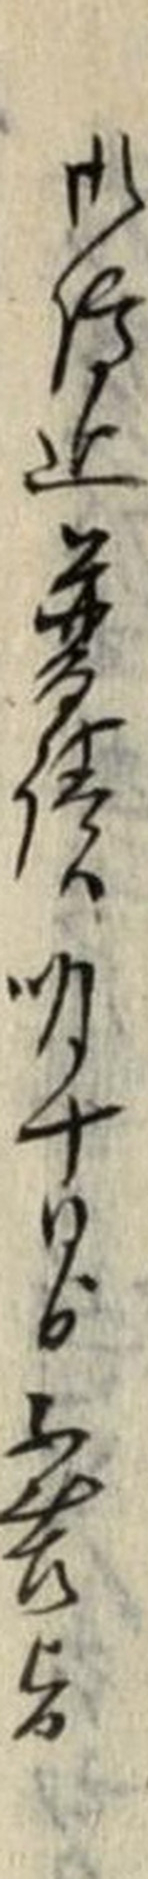御停止普請は明十日ゟ不苦旨
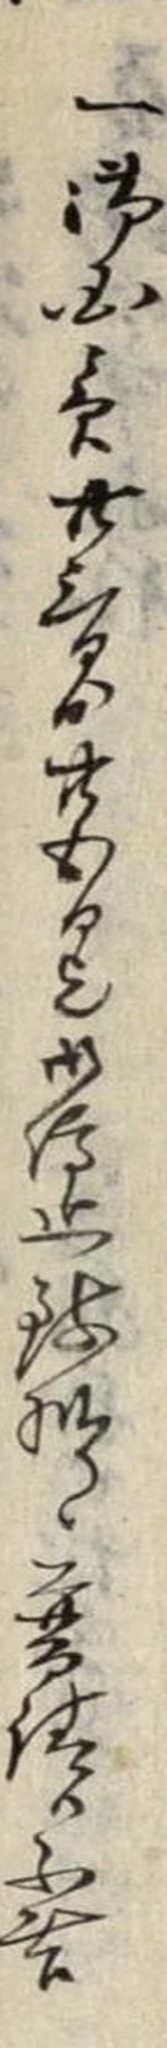一御国にては廿三日ゟ廿五日迄御停止致掛り候普請は不苦
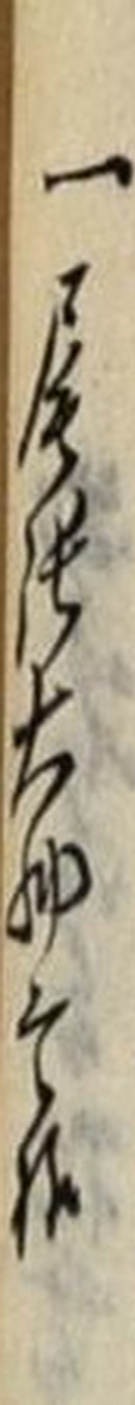一尾張大納言様
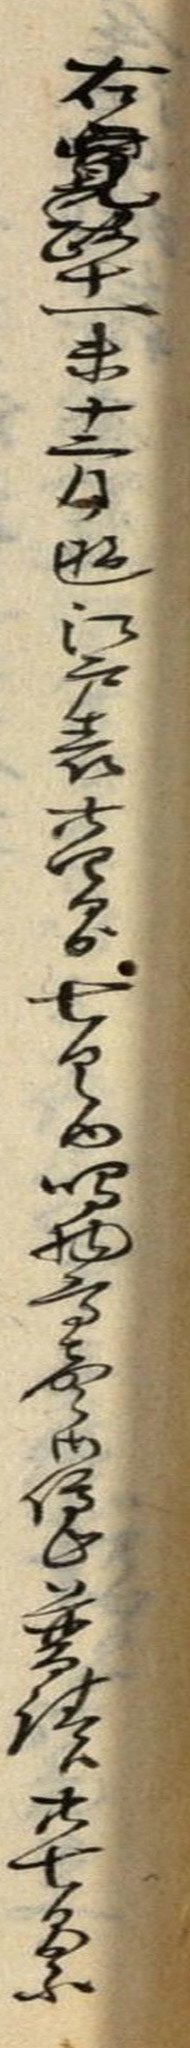右寛政十一未十二月逝江戸表廿四日ゟ七日之内鳴物高声御停止普請は廿七日ゟ不
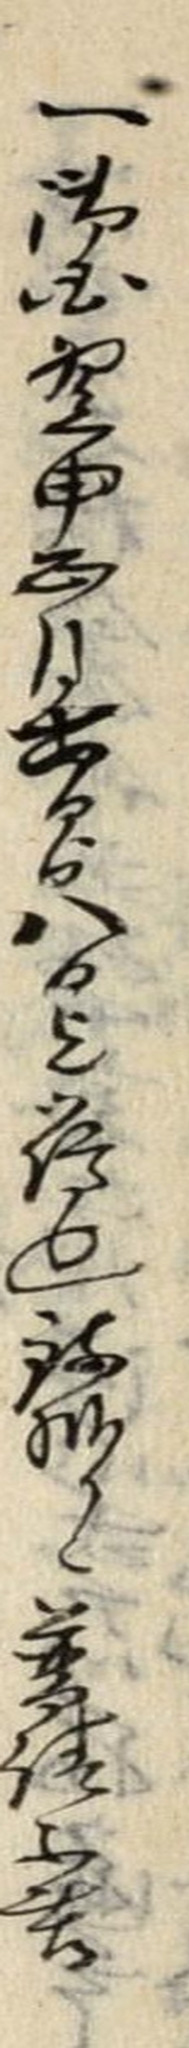一御国翌申正月六日ゟ八日迄御停止致掛り候普請不苦
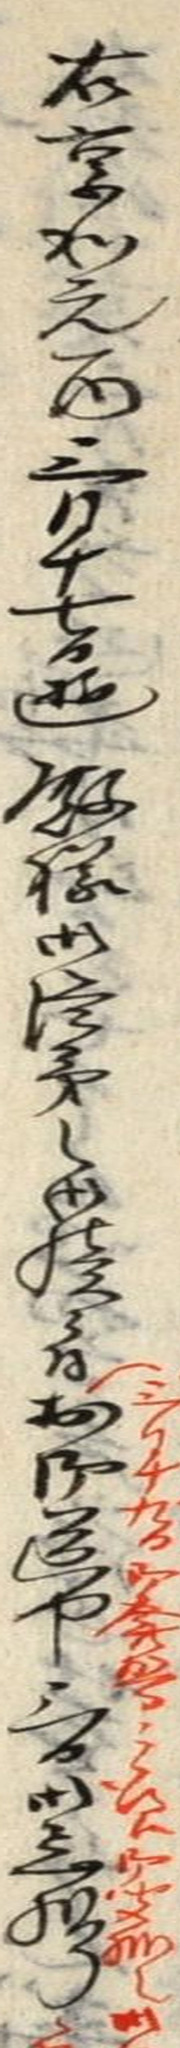右享和元酉三月十七日逝殿様御従弟之御続に付於御道中三日御忌掛り
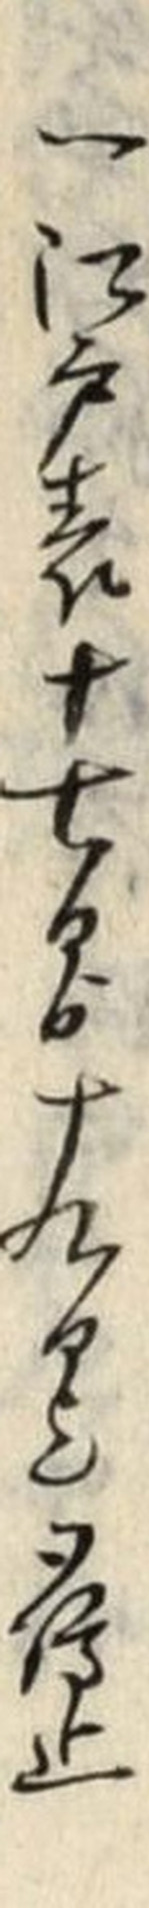一江戸表十七日ゟ十九日迄御停止
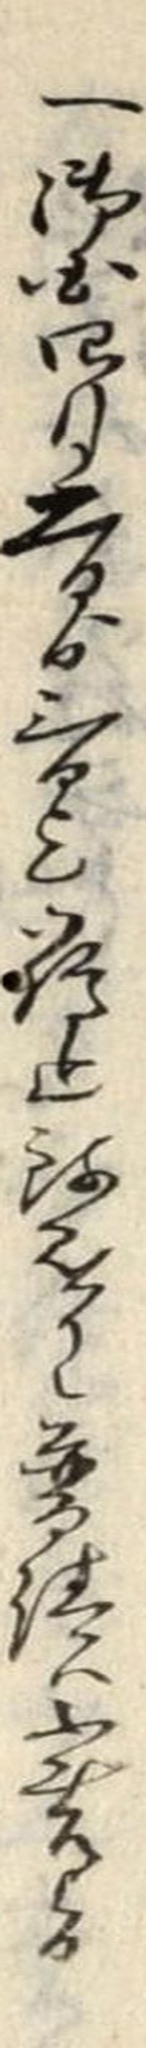一御国四月二日ゟ三日迄御停止致懸り候普請は不苦旨
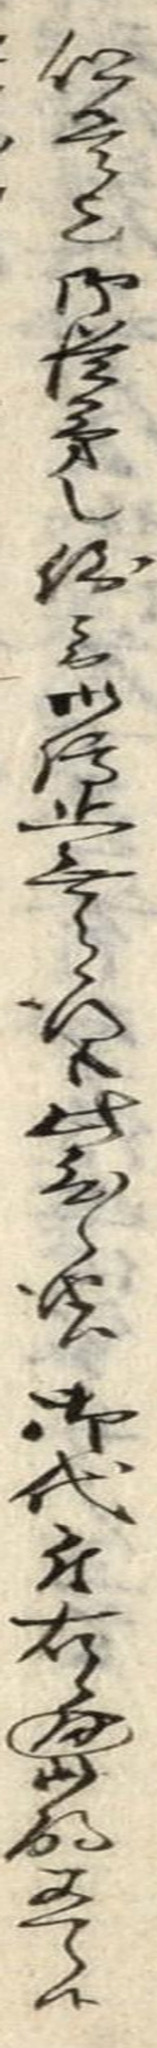但是迄御従弟之例にて御停止無之候得共此度之儀は御代に付右之通御触有之候
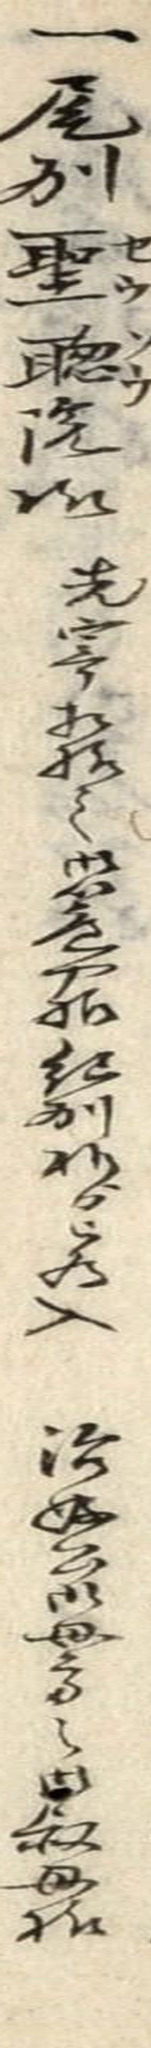一尾州聖聡院様先宰相様之御簾中様紀州様ゟ被為入治好公御母方之御叔母様
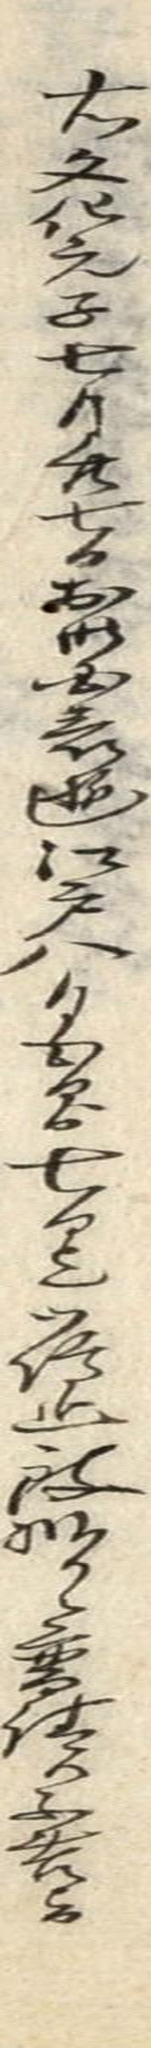右文化元子七月廿七日於御国表逝江戸八月五日ゟ七日迄御停止致掛り候普請は不苦旨
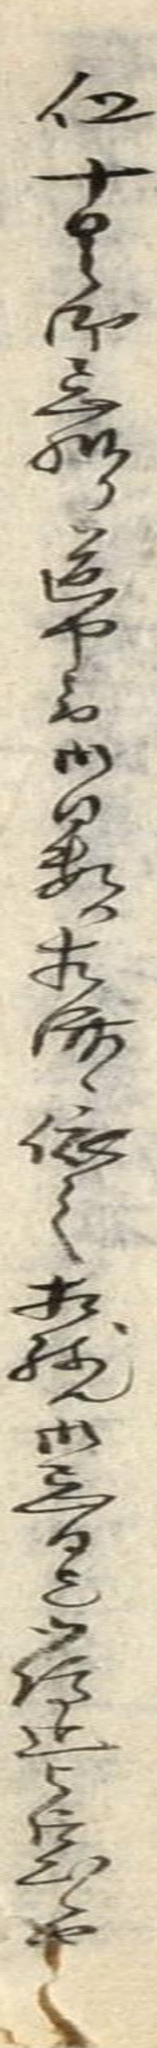但十日之御忌掛り道中にて御日数は相済候依之相残ル御忌日迄御停止被仰出候由
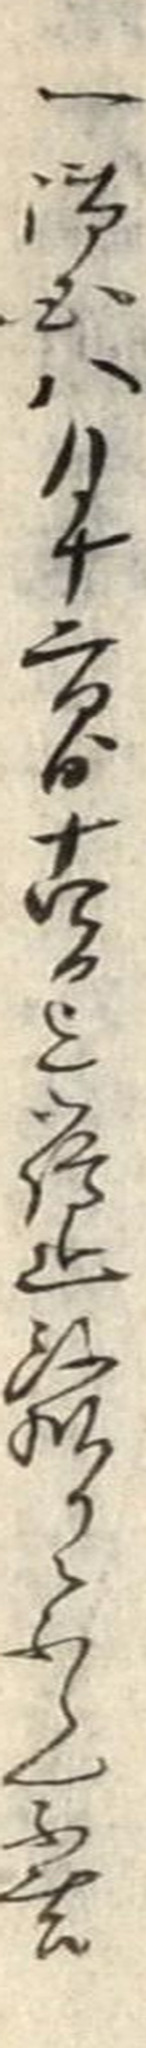一御国八月十二日ゟ十四日迄御停止致掛り候ふしん不苦
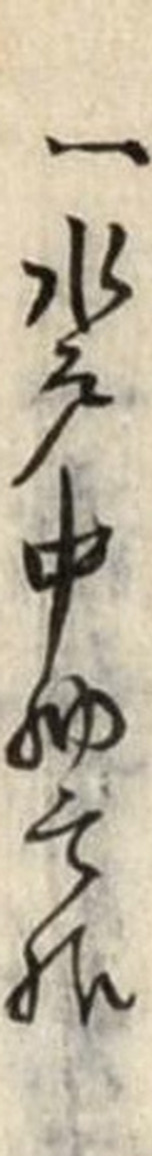一水戸中納言様
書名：御停止異変死失
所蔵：福井県文書館 Fukui Prefectural Archives
